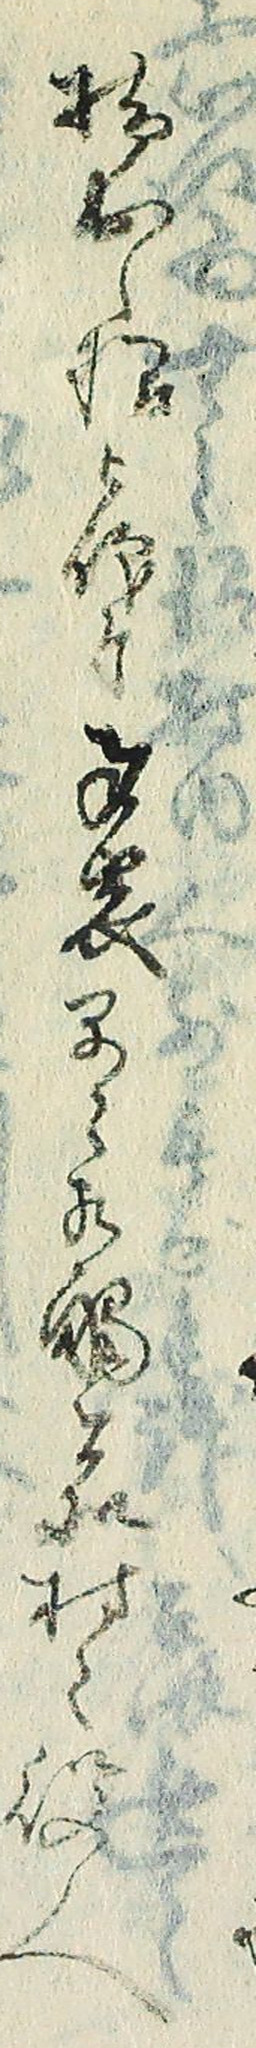指出候様被仰付奉畏早々相触候処村々役人
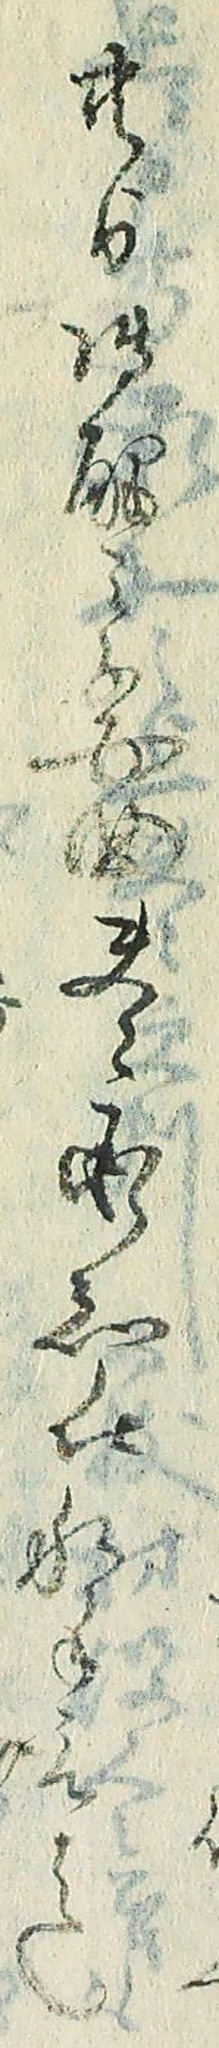共ゟ御触之委曲夫々承知し仕私手元迄
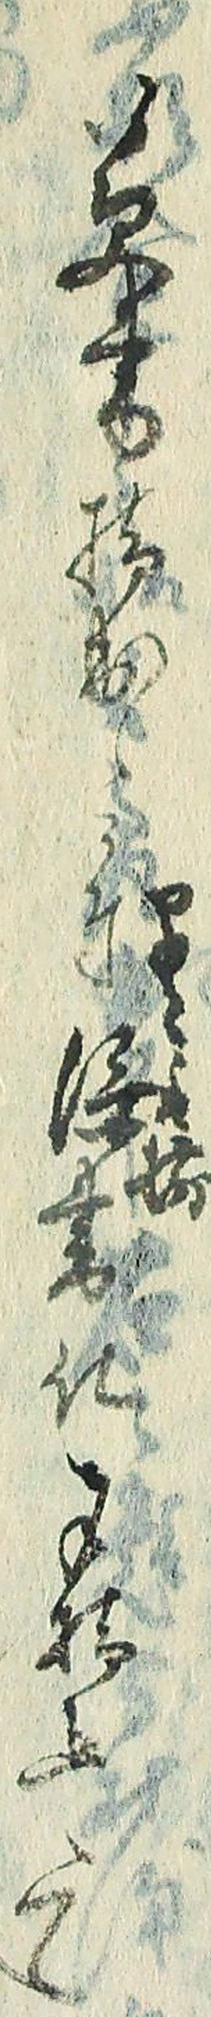御受書指出候に付早々取揃添書仕奉指上候以上
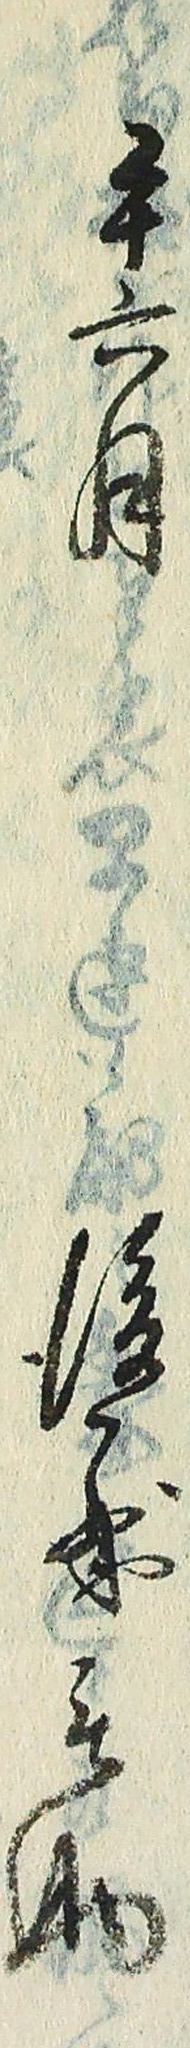午六月後藤庄助
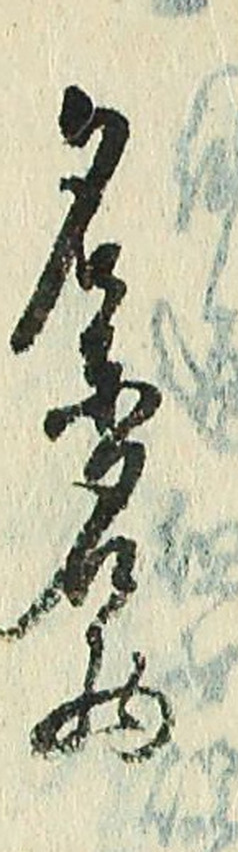名東名西
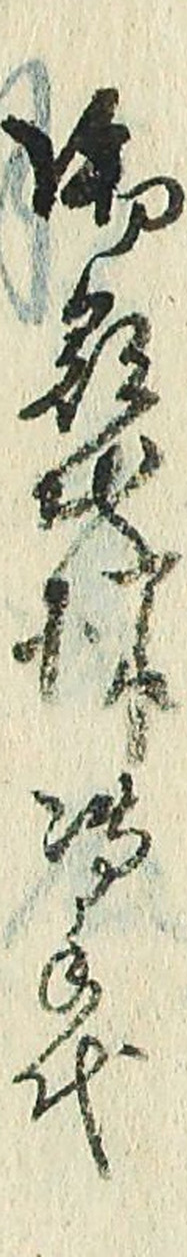御郡代様御手代
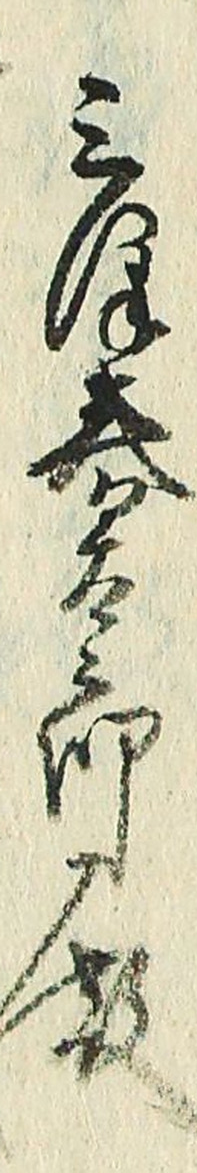三沢春太郎殿
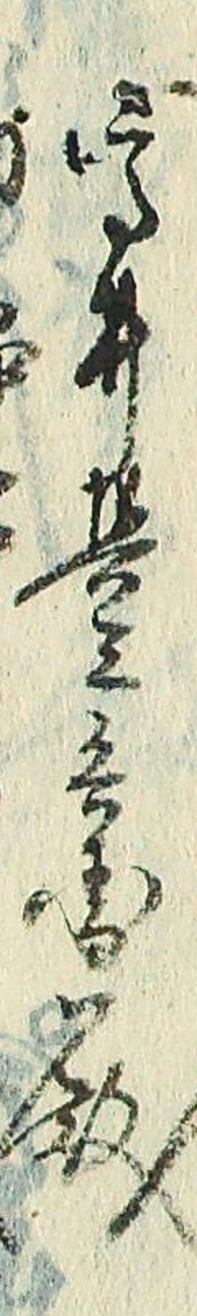高井与三兵衛殿
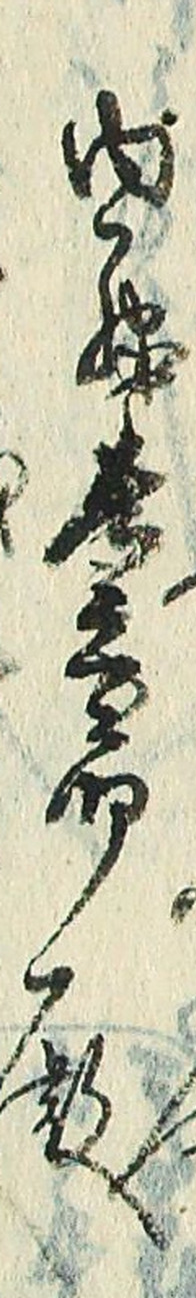内藤長三郎殿
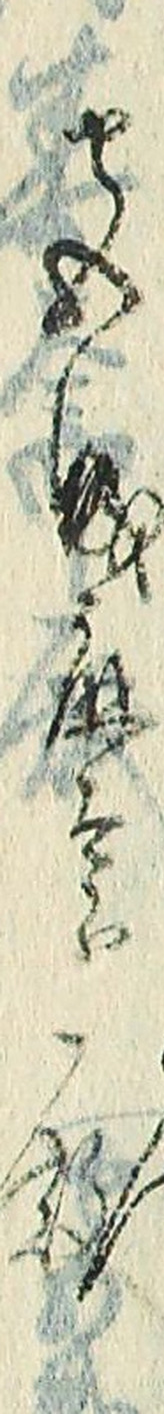宮城麻太郎

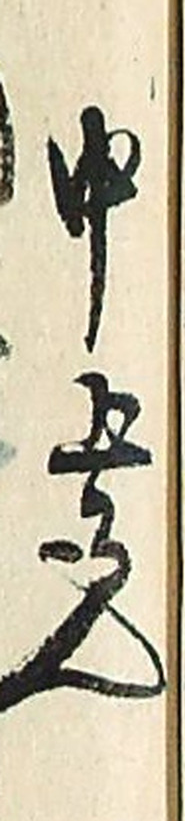申上覚
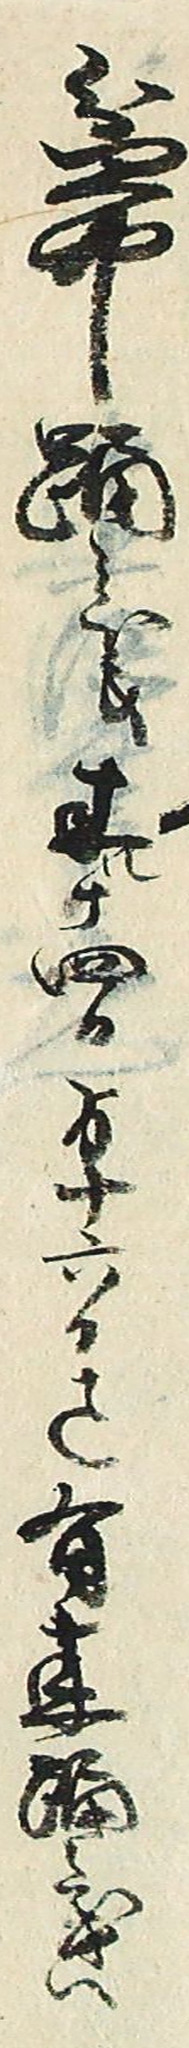盆中踊之義来る十四日より十六日迄有来踊之義は
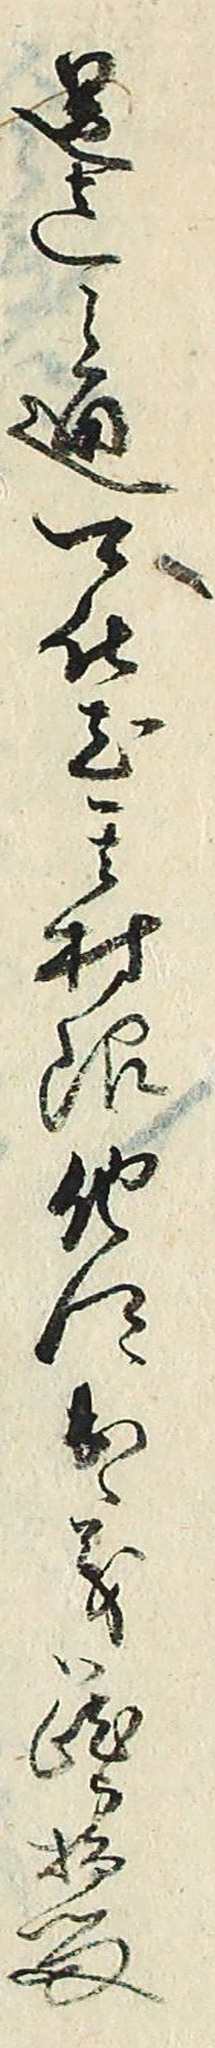是迄之通可仕尤其村限他郷へ出候義は屹と指留
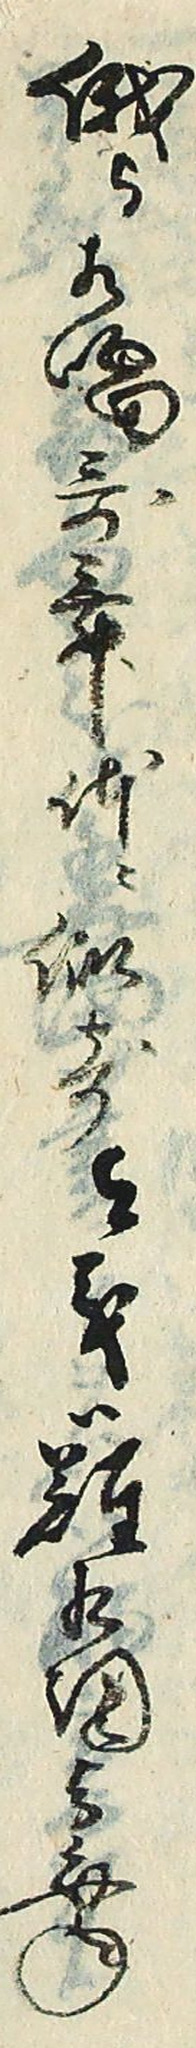俄と相唱哥舞体に似寄候義は難相調旨毎年
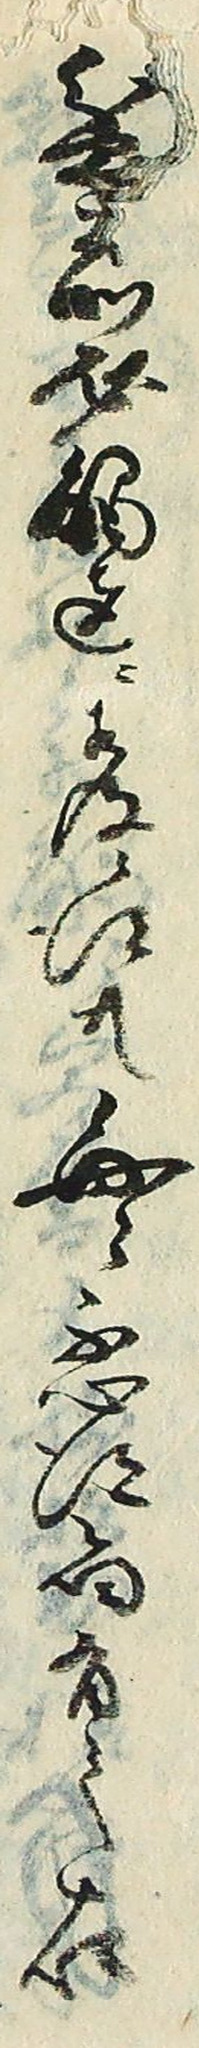盆前必触達に相及候得共毎々不心得者有之右
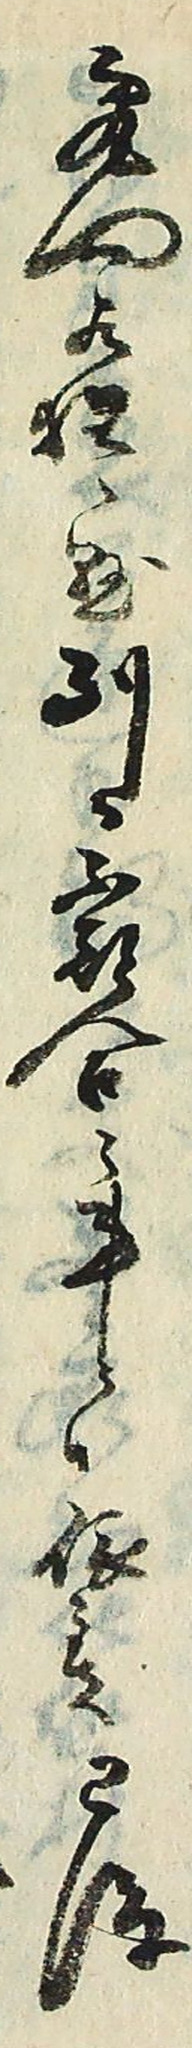究向相猥候懸別而不都合之事に候依而は已後
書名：諸御用御□受書控
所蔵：鳴門教育大学 Naruto University of Education
